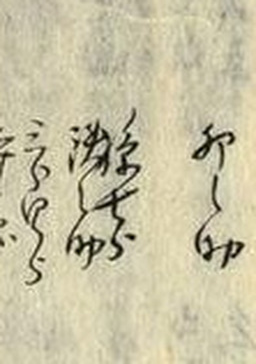源次郎
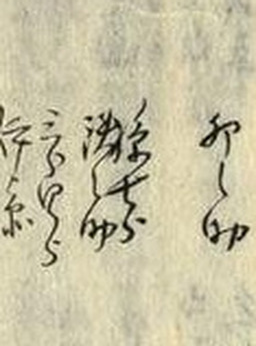源次郎
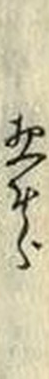亀次郎
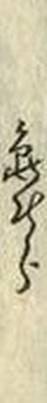亀次郎
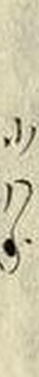小八郎
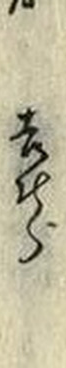亀次郎
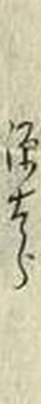源次郎
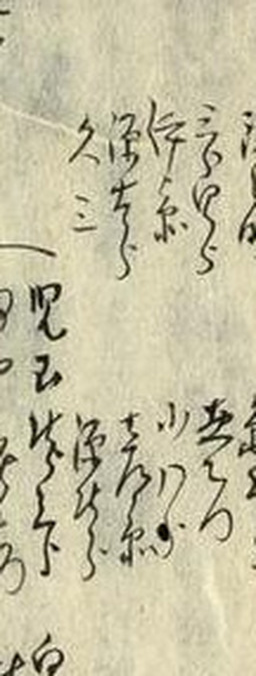源次郎
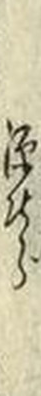源次郎
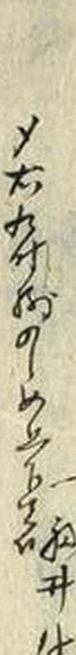〆右九時揃のしめ上下着
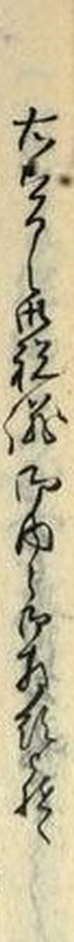右今日之御祝儀御内々御拝領被遊候
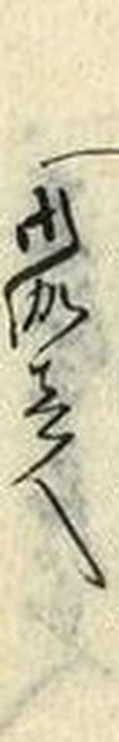御伽壱人
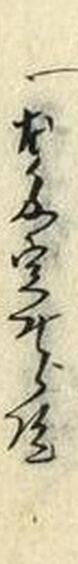本多定次郎殿
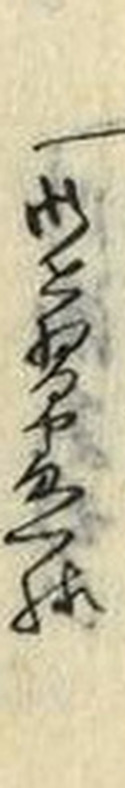御近習番一縁

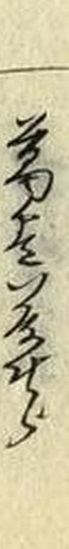葛巻藤次郎
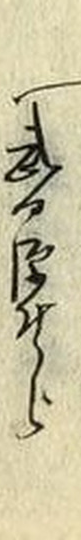武田源次郎
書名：少傅日録抄（斉善付側向頭取日記、在府）
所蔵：福井県文書館 Fukui Prefectural Archives
